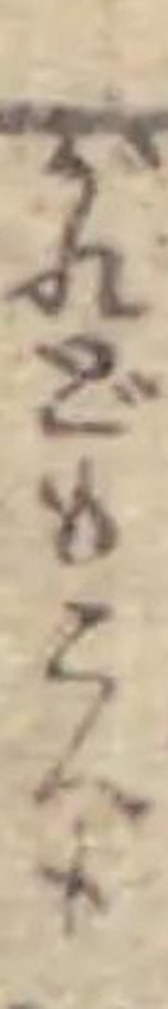がれどもこへも
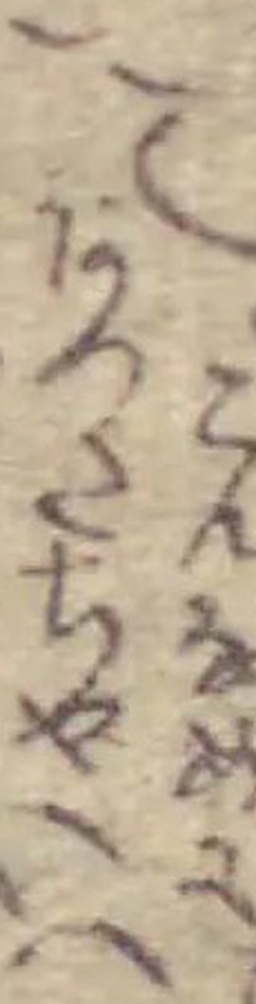あつたちや
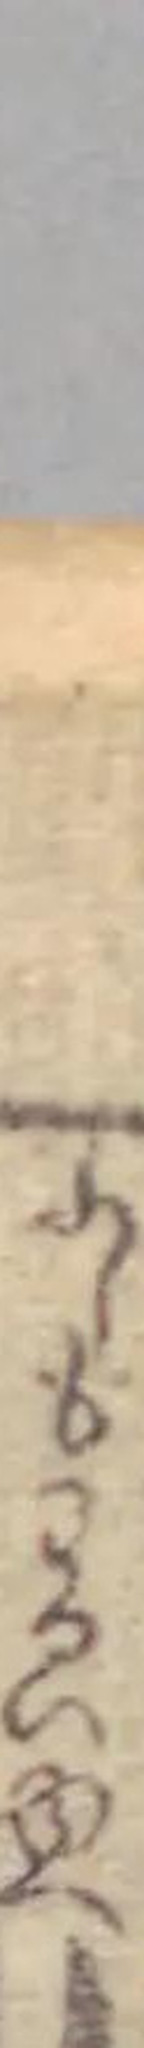ふしもわるいゆへ
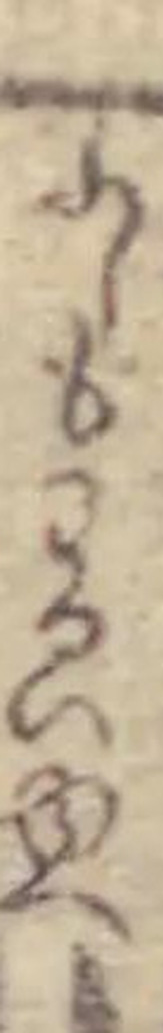ふしもわるいゆへ
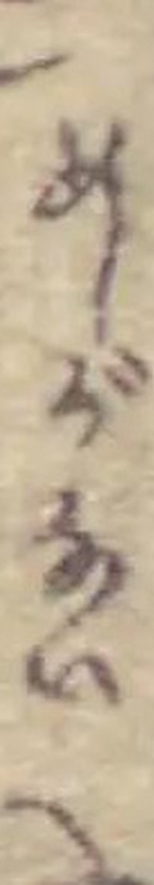めしがない
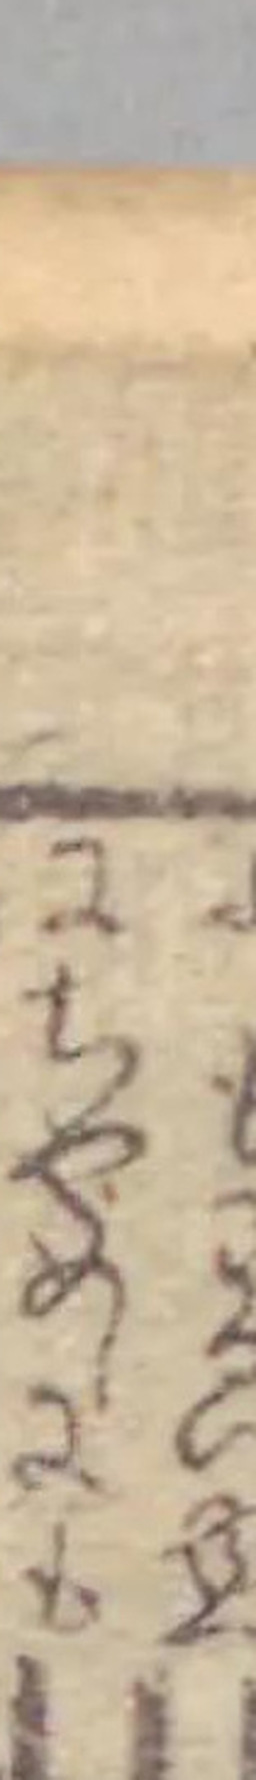にちやめしにも
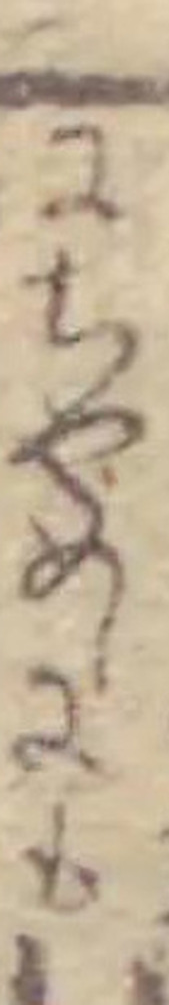にちやめしにも
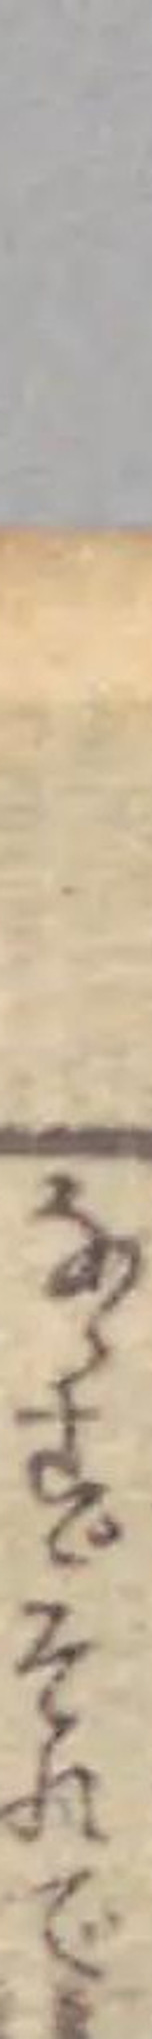ならずそれで
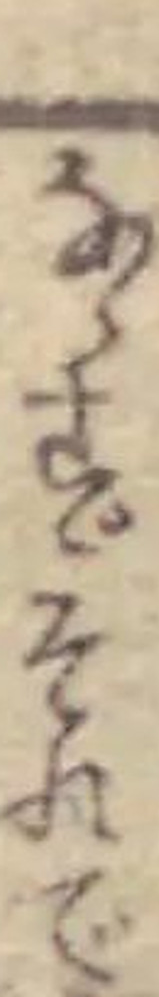ならずそれで
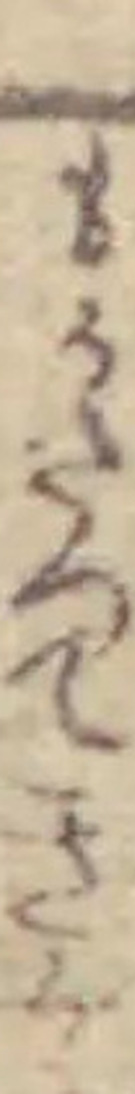もかたつてきか
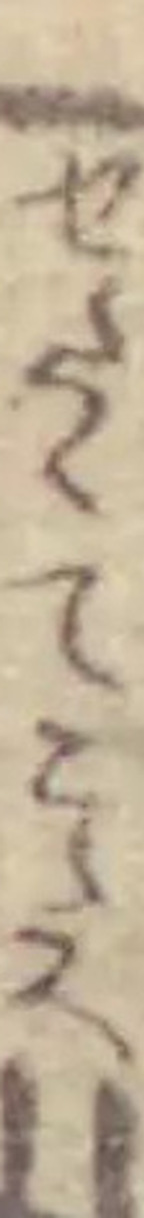せたくてこたへ
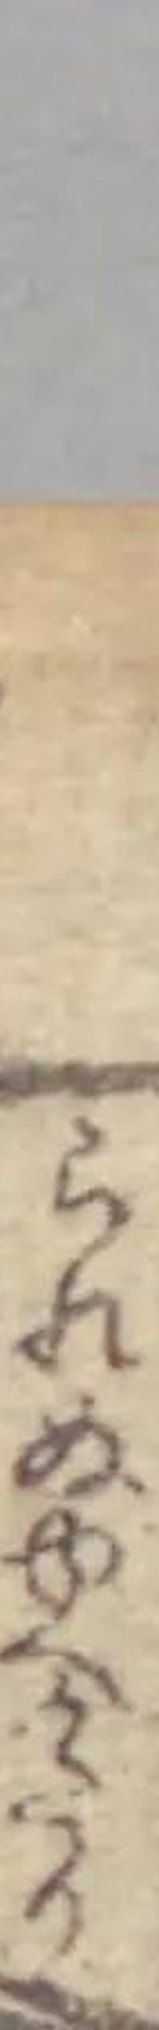られぬゆへかたり
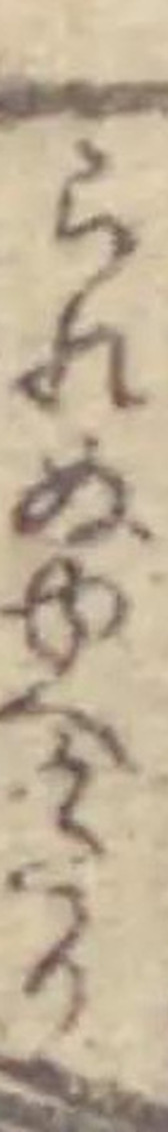られぬゆへかたり
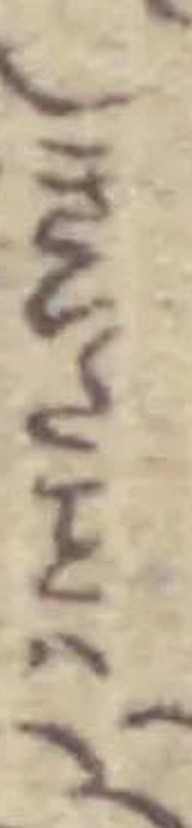きいたことは
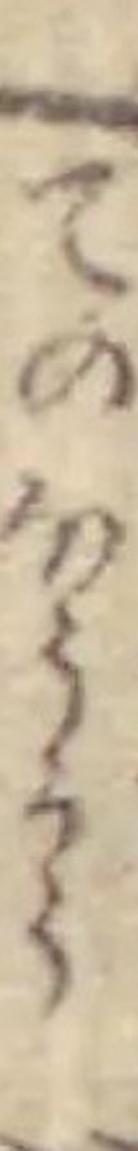てのほうから
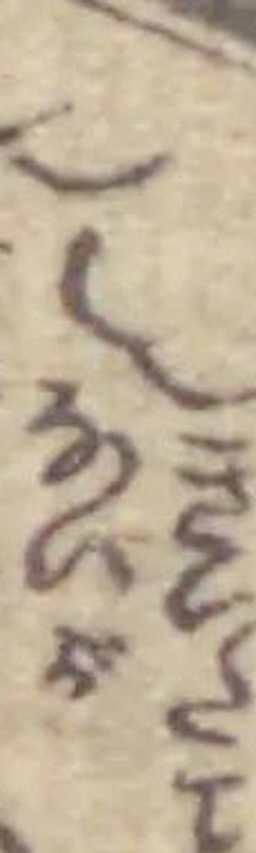ないが
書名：茶羅毛通人 3巻
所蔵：国立国会図書館 National Diet Library, JAPAN
